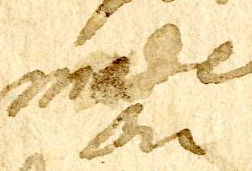made
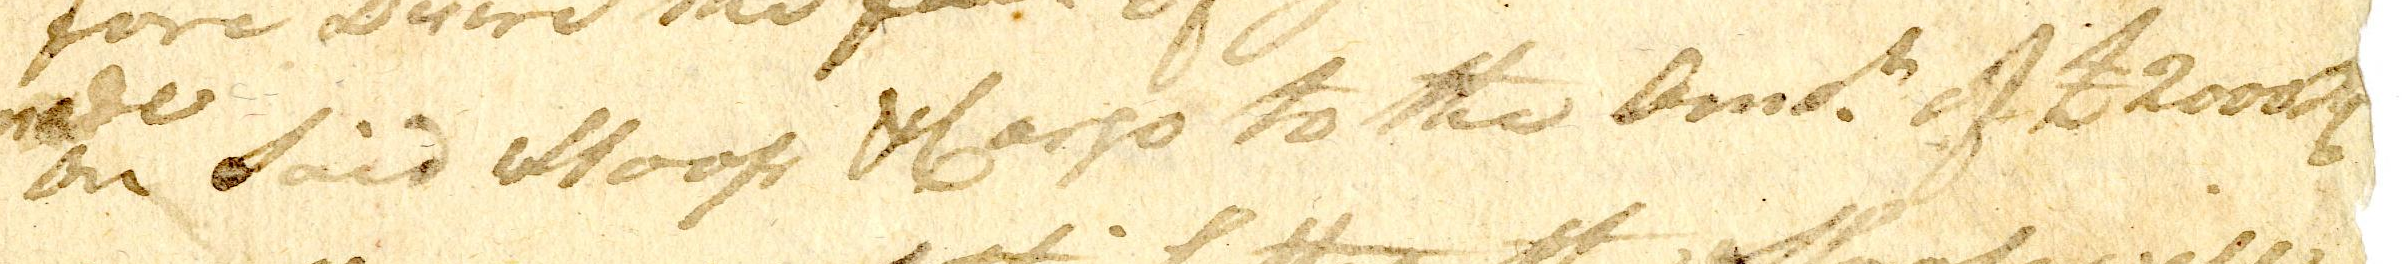^ on Said sloop & cargo to the amo^t. of £20000
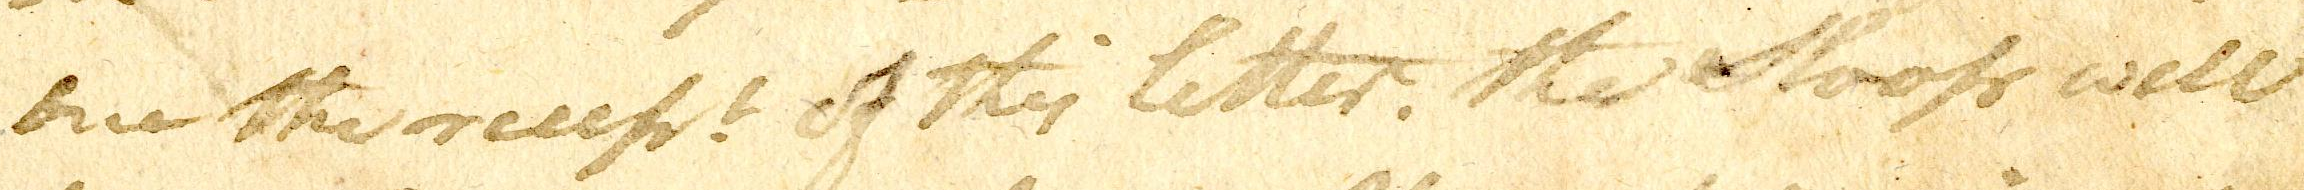on the recep^t. of this letter, the Sloops will
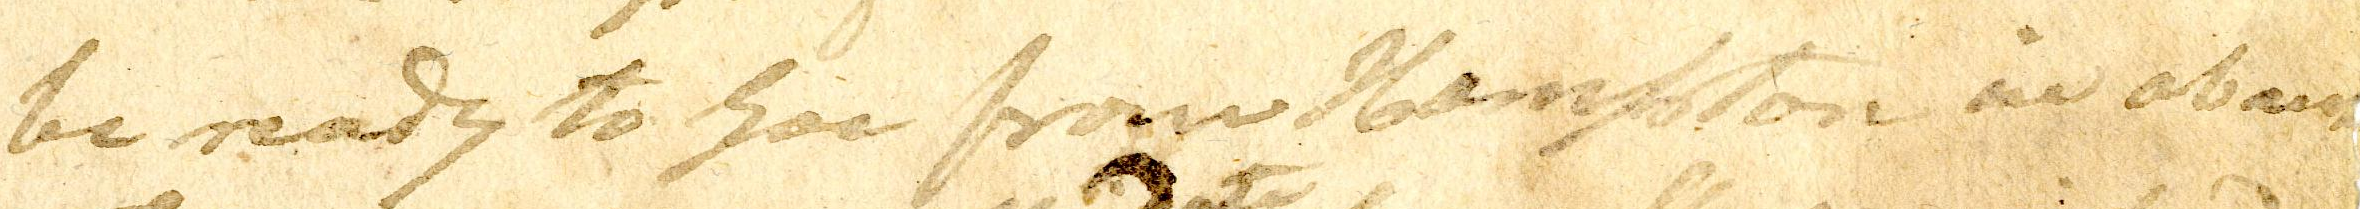be ready to goe from Hampton is about
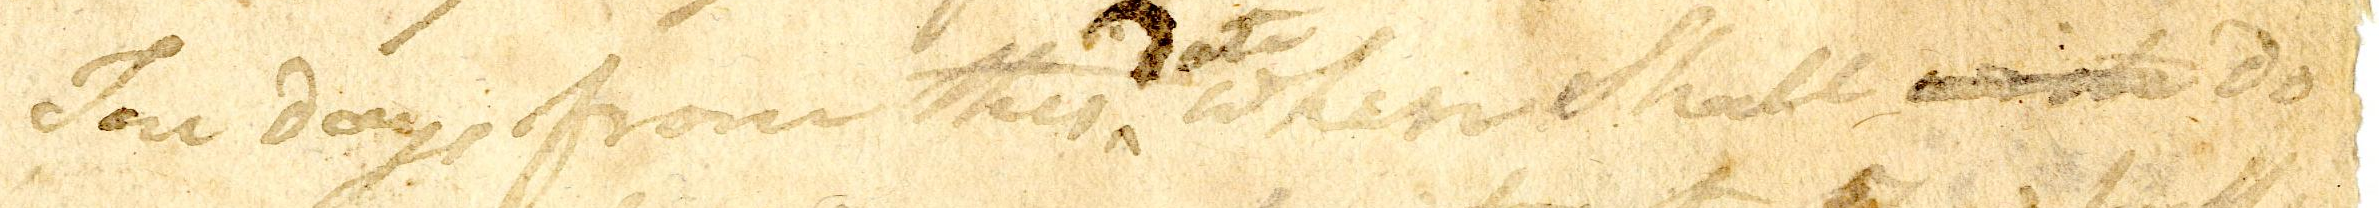two days from this ^, when Shall [_____] do
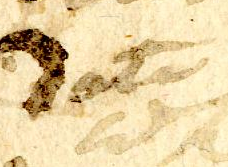date
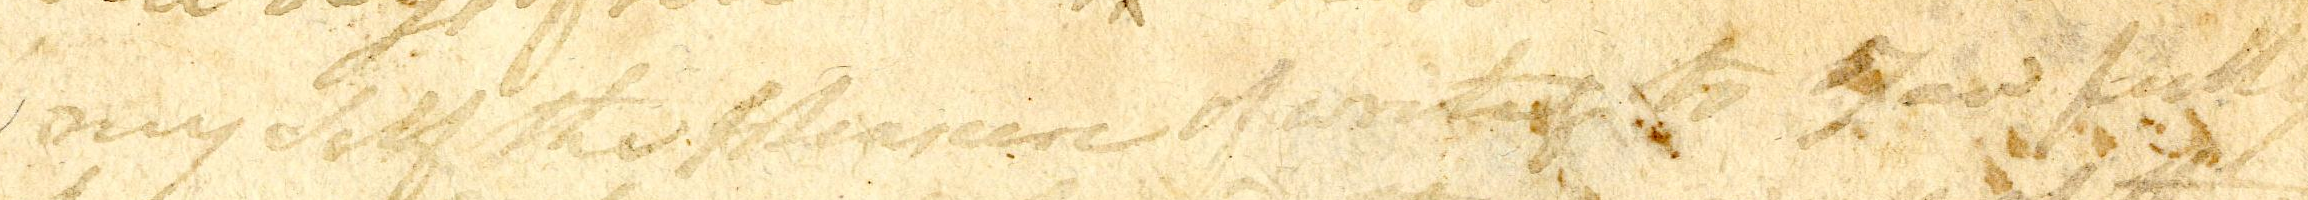my self the Pleasure coming to you first
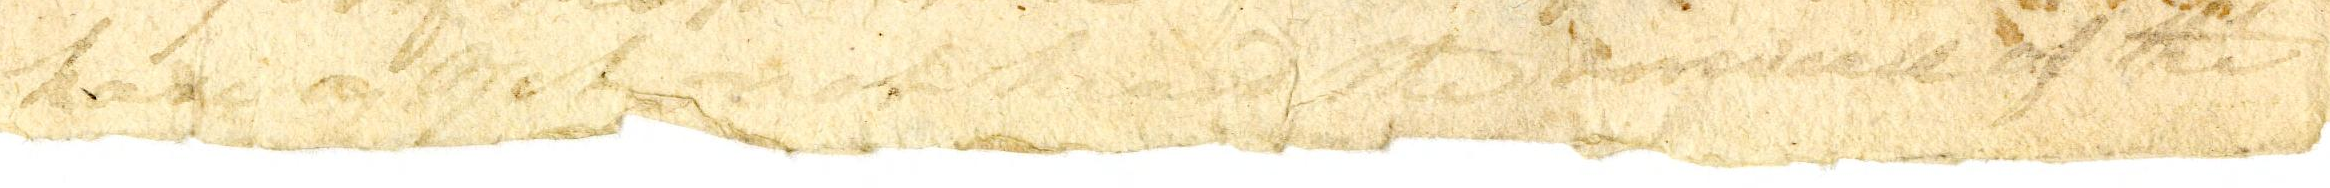had as yet not having the insurance of the
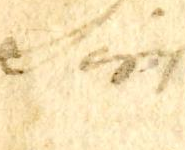Sirs
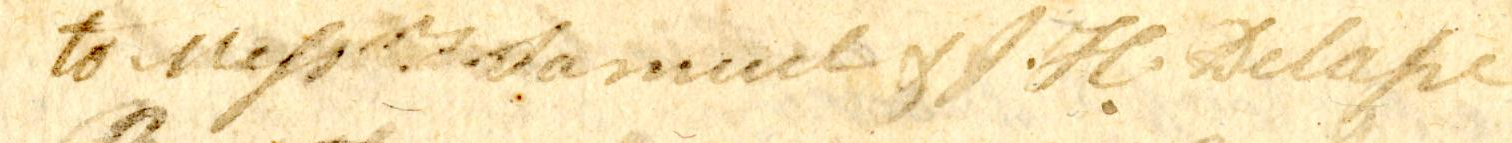to Mess^rs. Samuel & J. H. Delasse
